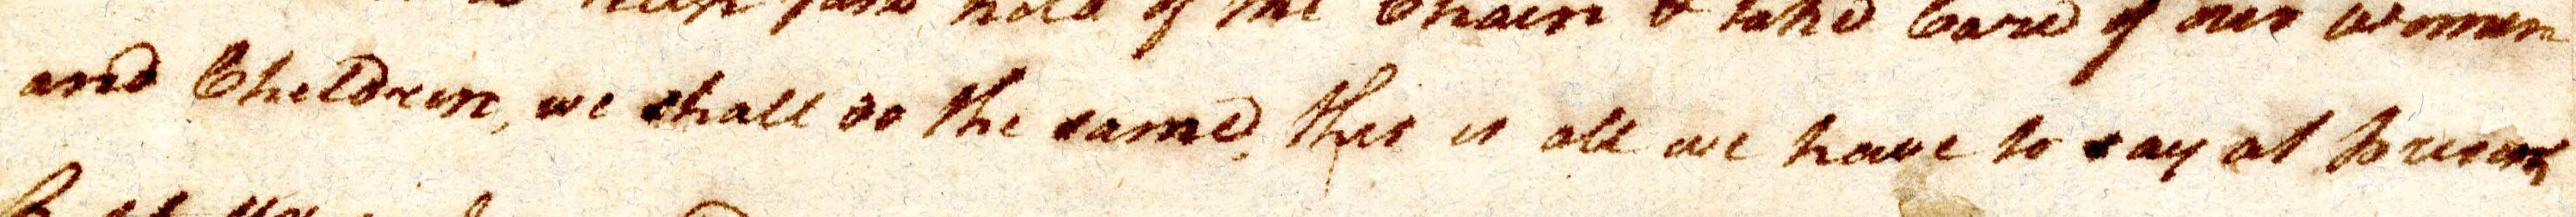and Children, we shall do the same, this is all we have to say at present
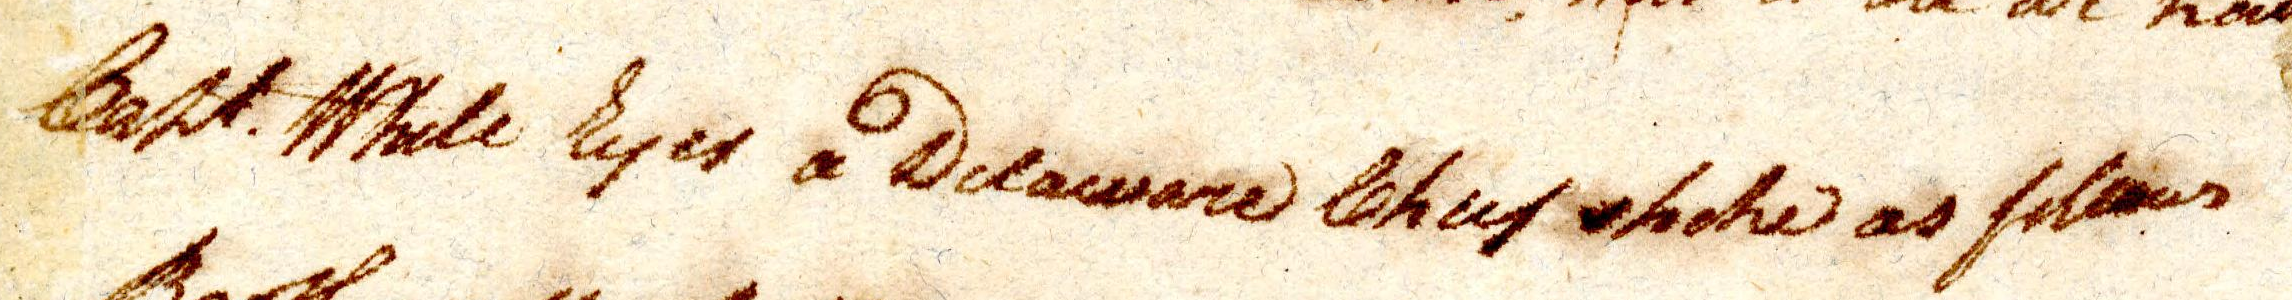Capt. White Eyes a Delaware Chief spoke as follows
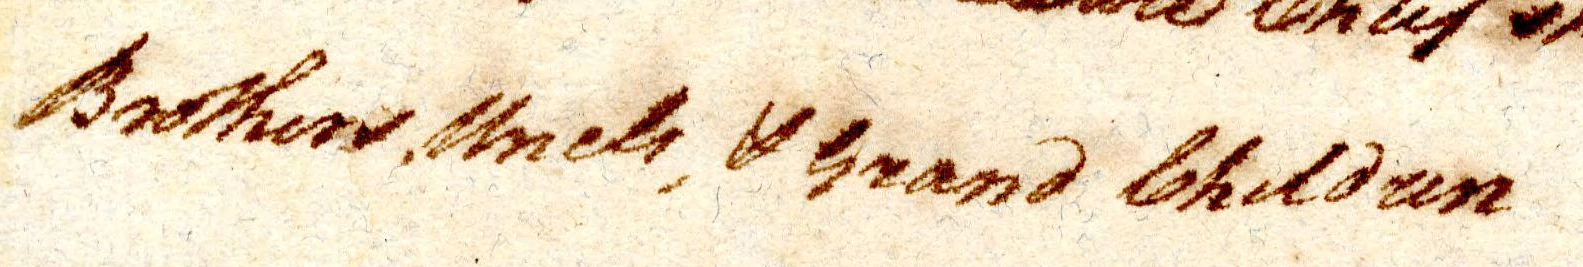Brothers, Uncles, & Grand Children
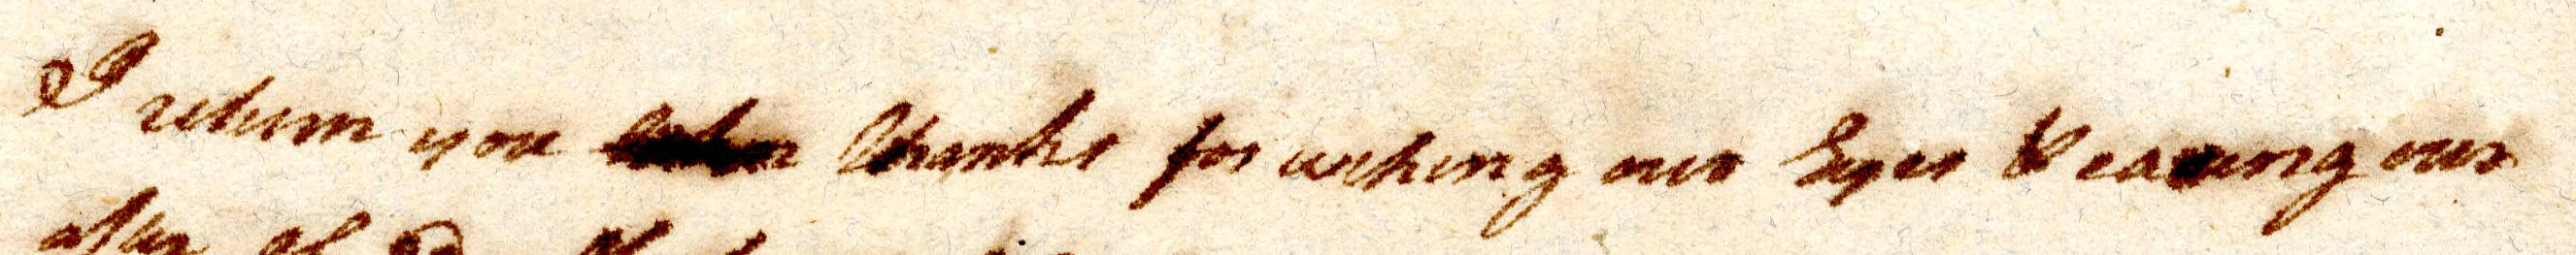I return you [____] thanks for wiping our Eyes & easing our
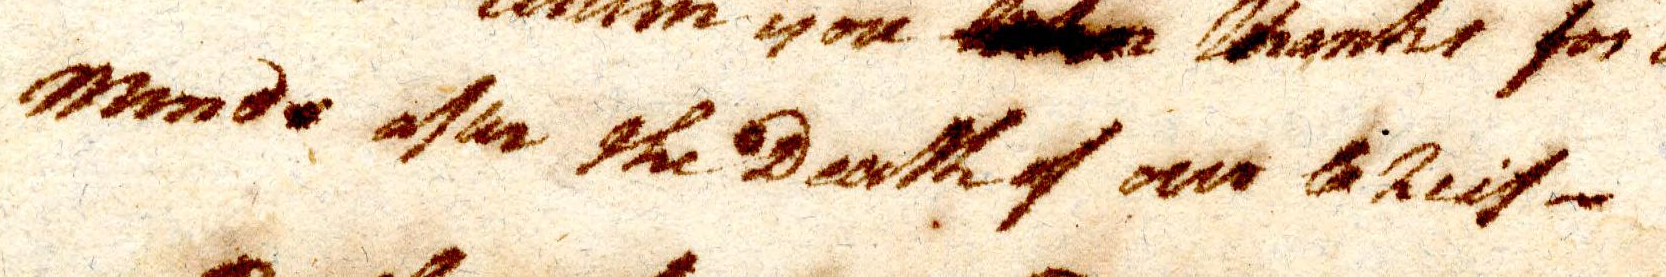minds after the Death of our Cheif-
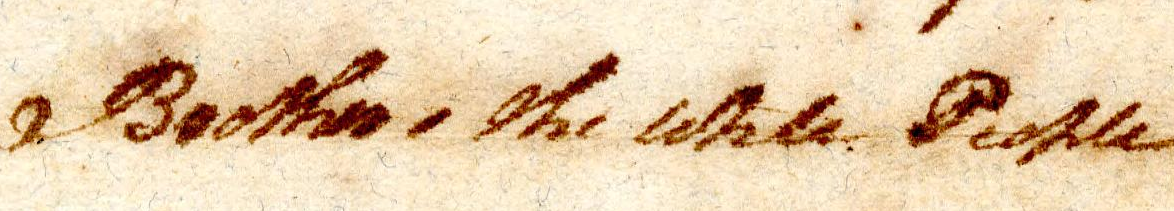Brothers, the white People
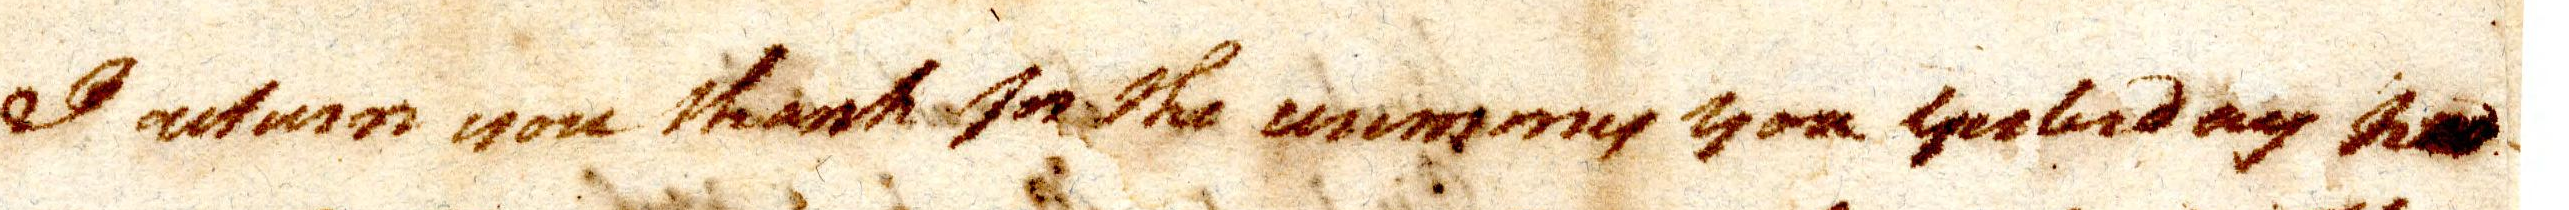I return you thank in the ceremonies you yesterday paid
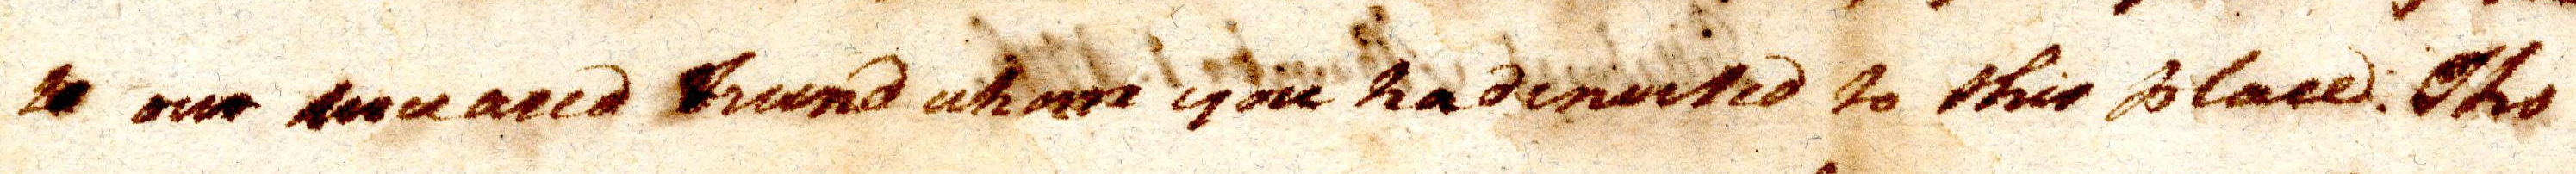to our deceased Friend whom you had invited to this Place. Tho
